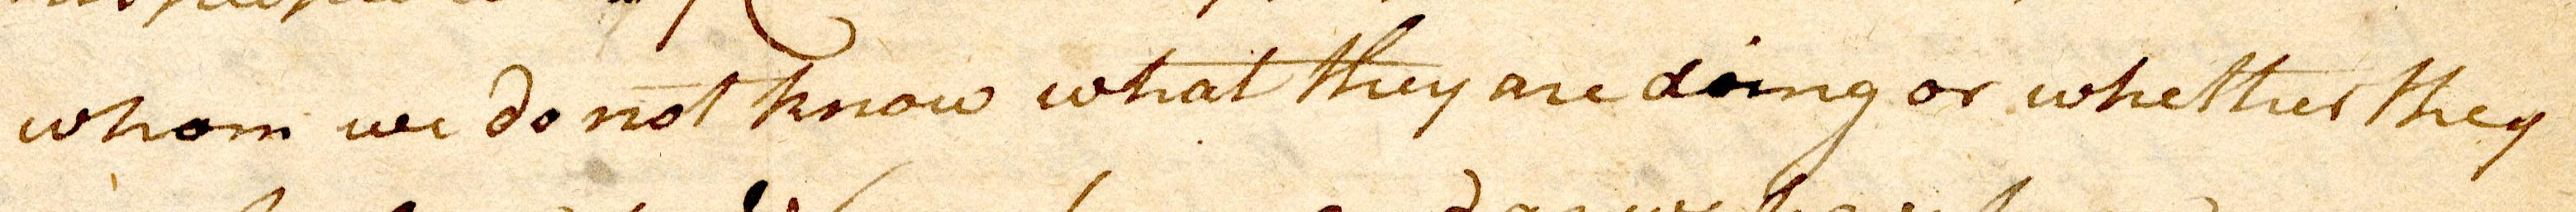whom we do not know what they are doing or whether they
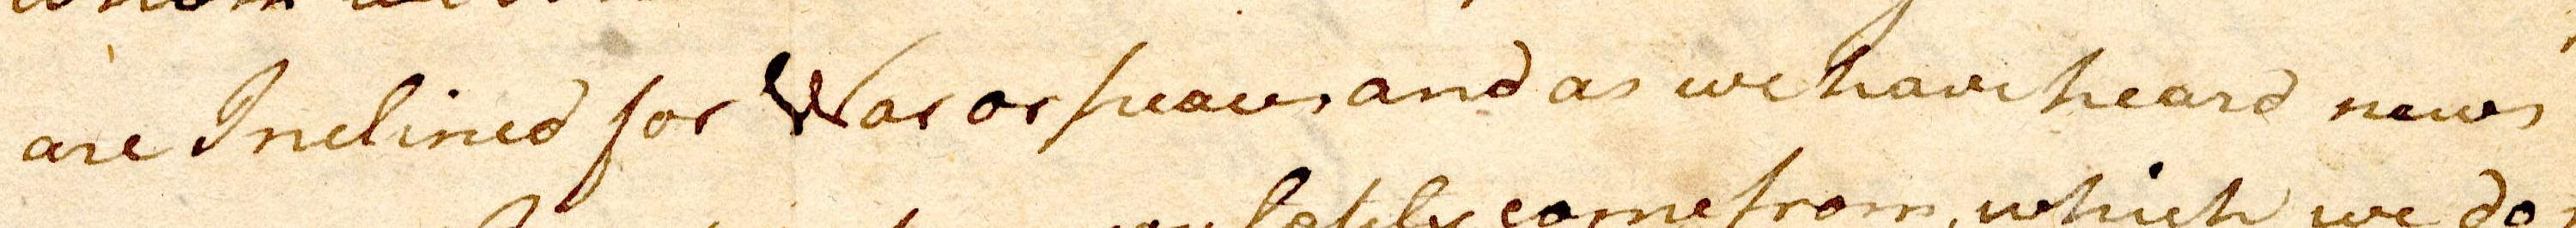are Indians for War or peace, and as we have heard news
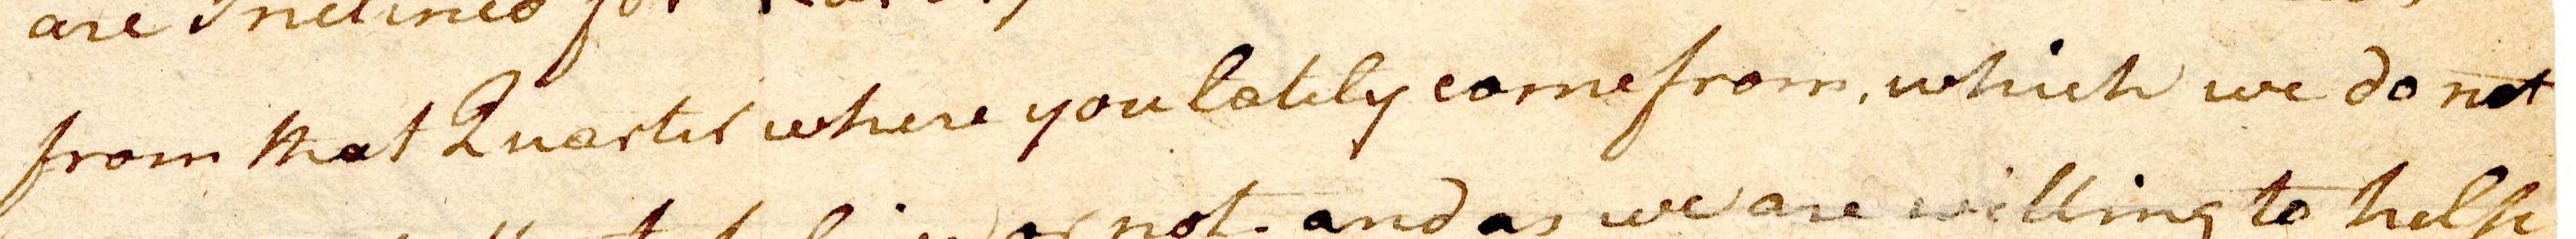from that Quarter where you lately come from, which we do not
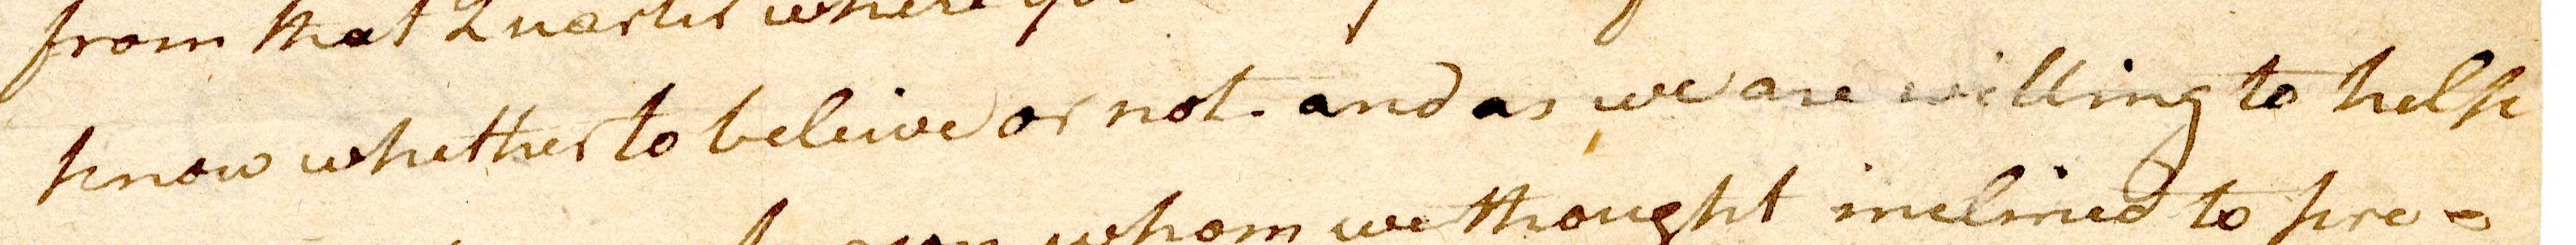know whether to believe or not. and as we are willing to help
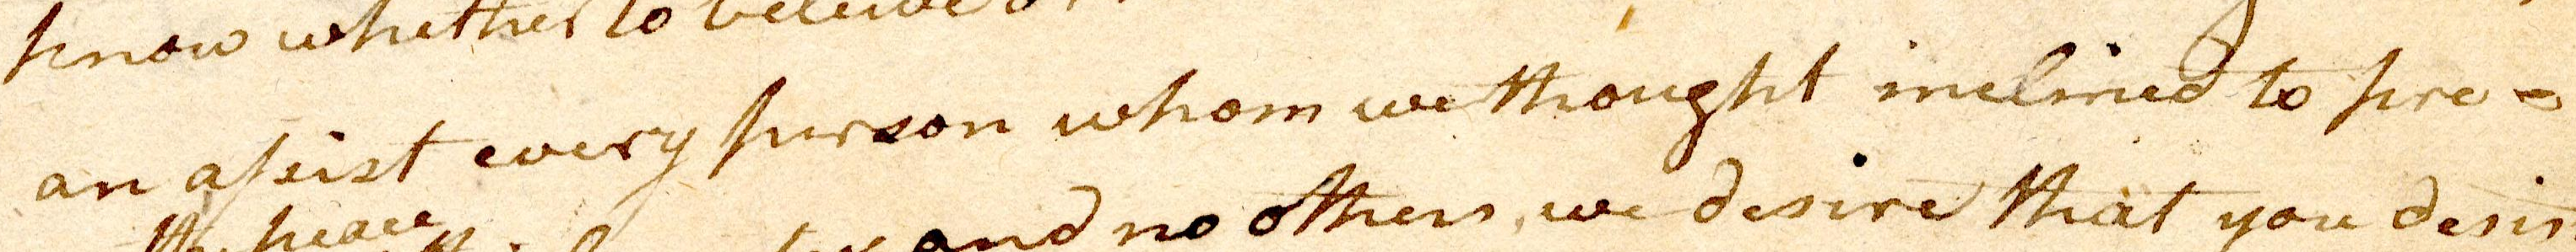an assist every person whom we thought inclined to pre-
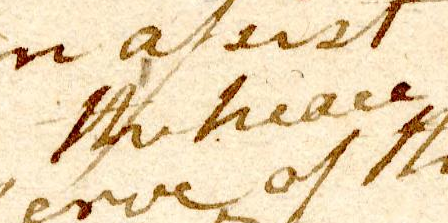the peace
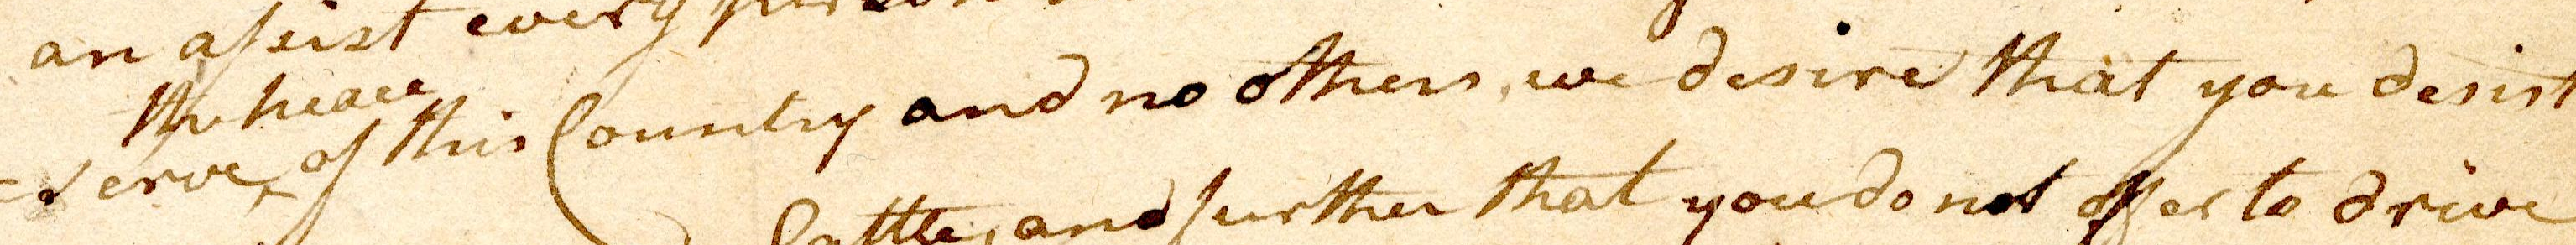-serve ^ of this Country and no others, we desire that you desist
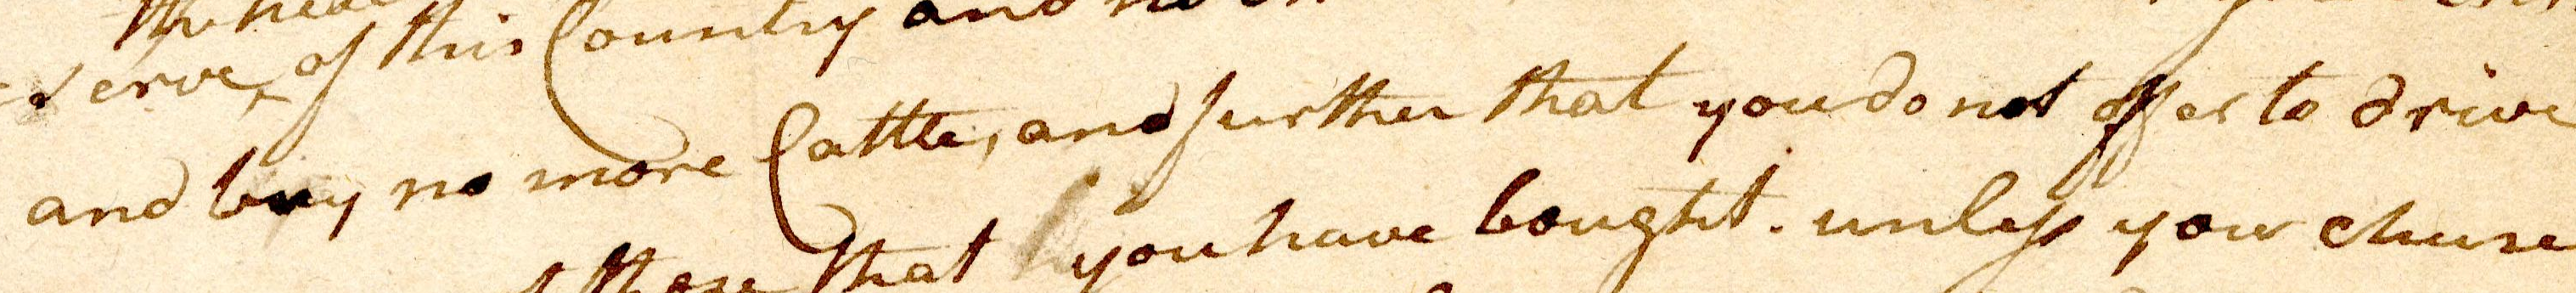and buy no more Catlle, and further that you do not offer to drive
